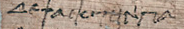δεφαϲκουϲινπα
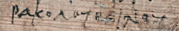ρακολουθεινου
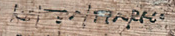κειταιπαρεϲο
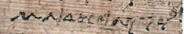μαιδεϲοιαυτον
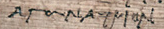αγωναυριον
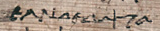εανδεδωιτα
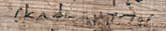ϲκαφ αυτοϲ
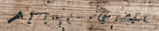αποιϲ
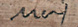μωι
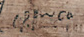ερρωϲο
